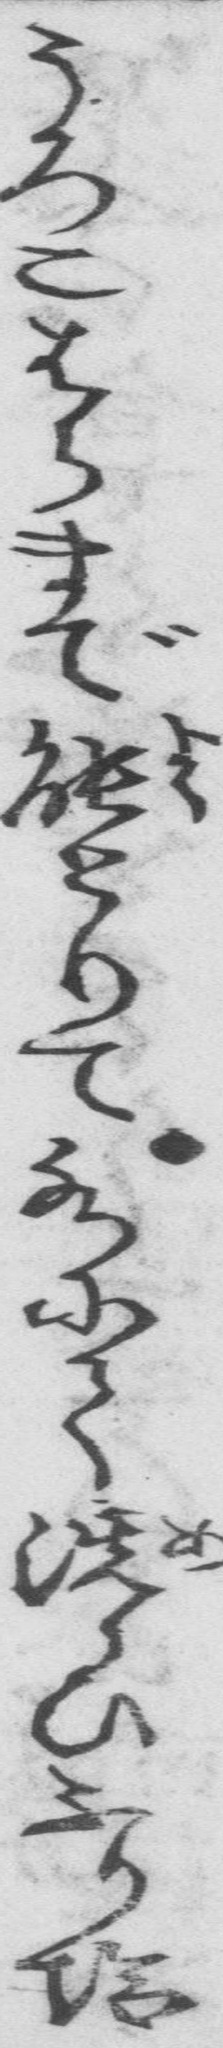うろこはらまで能とりて。水にて洗らひふり塩
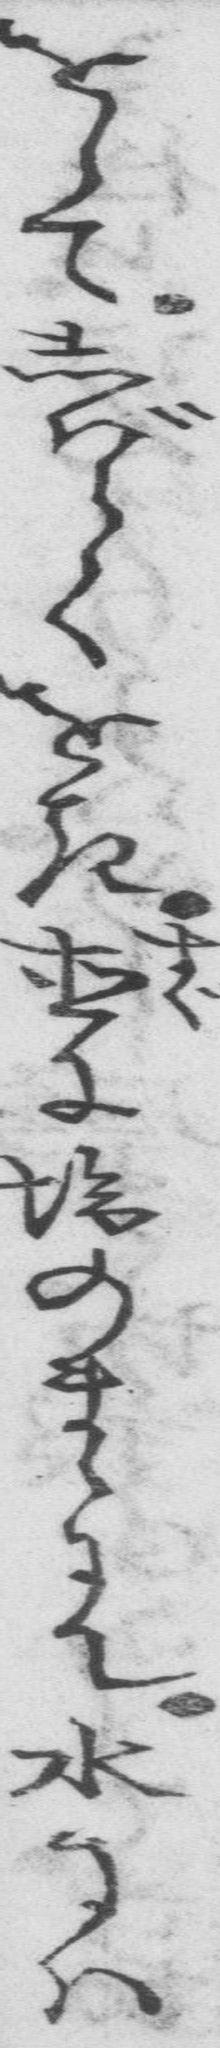をして。しばらくをき。直に塩のまゝにて。水には
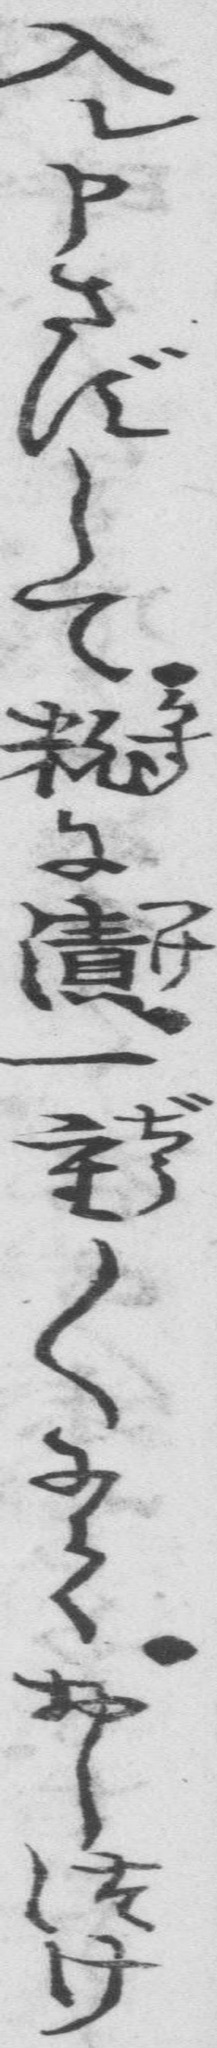入れ申さずして粕に漬。一重〳〵にて。おしつけ
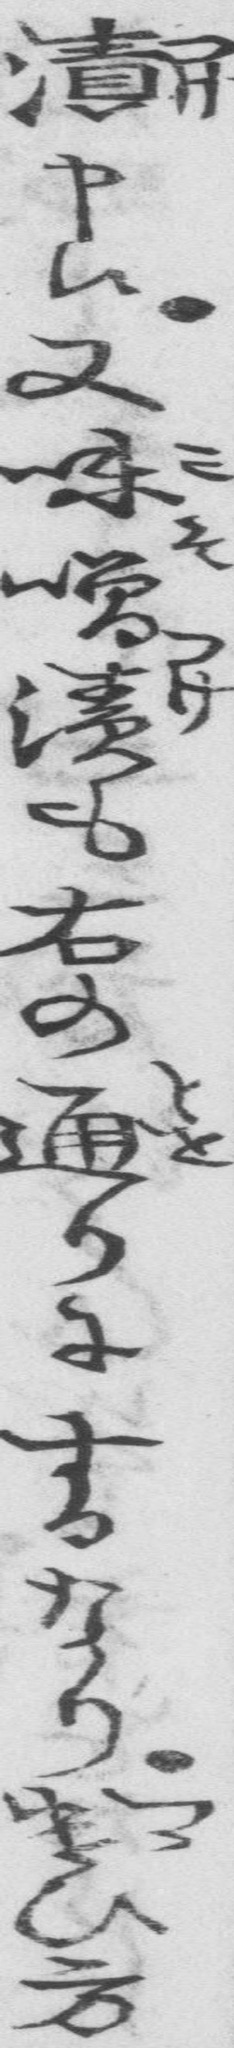漬申候。又味噌漬も右の通りにするなり。遣ひ方
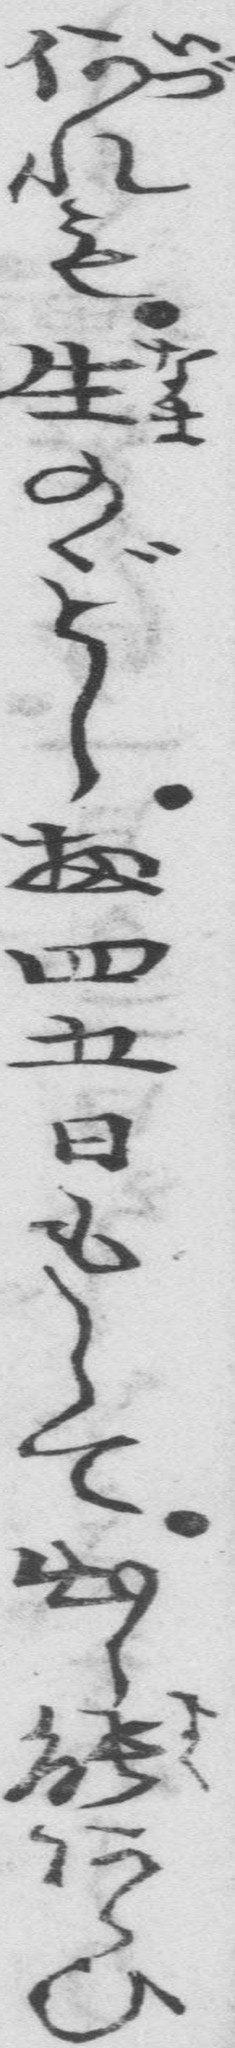何れも。生のごとし。扨四五日もして。出し能あらひ
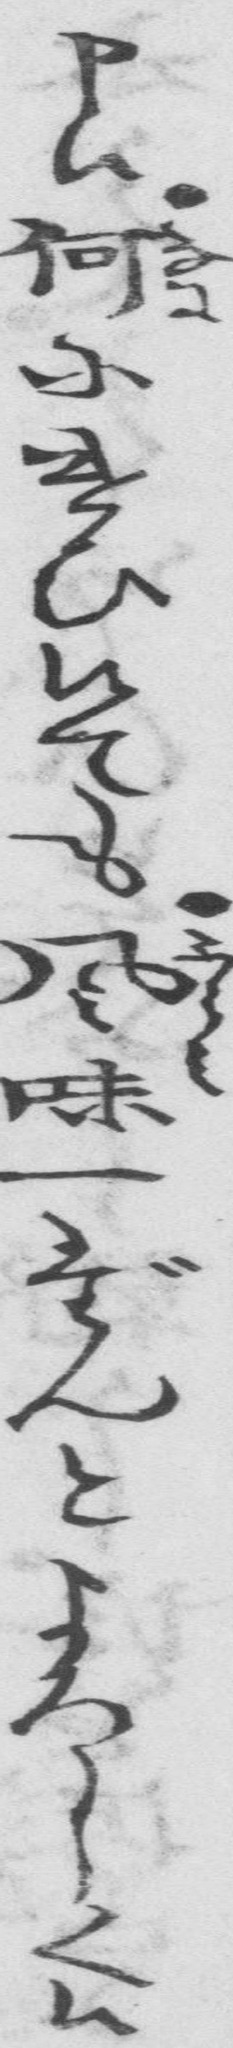申候。何に遣ひ候ても。風味一だんとよろしく候
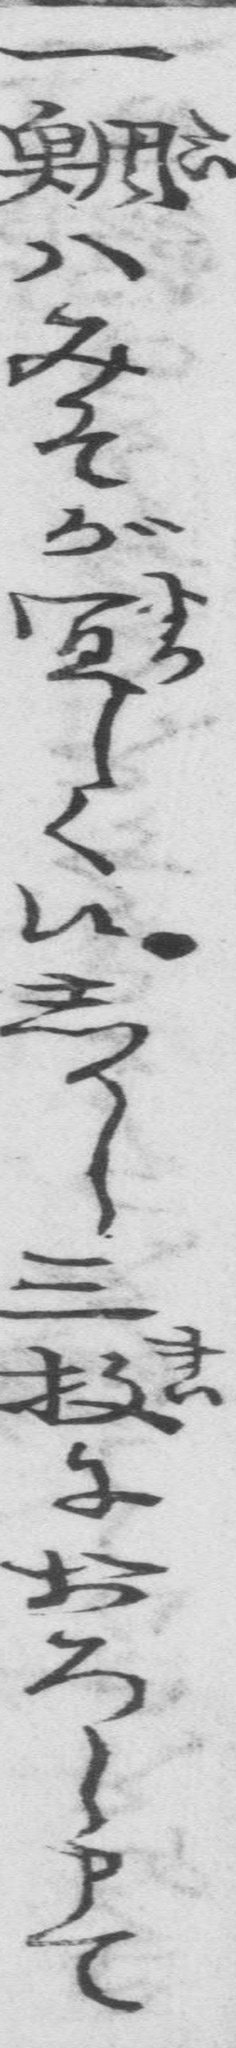一鯛はみそが宜しく候。しかし三枚におろし申て
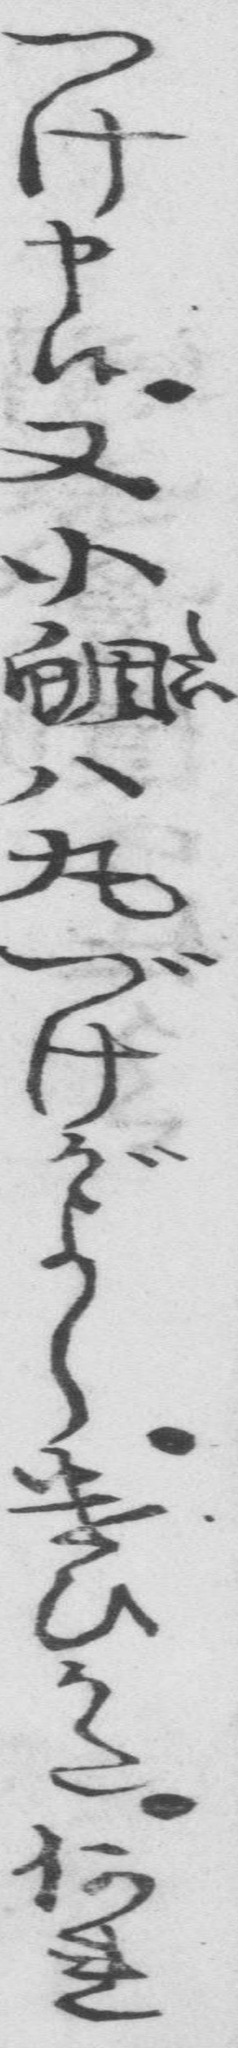つけ申候。又小鯛は丸づけがよし。遣ひかた。何れ
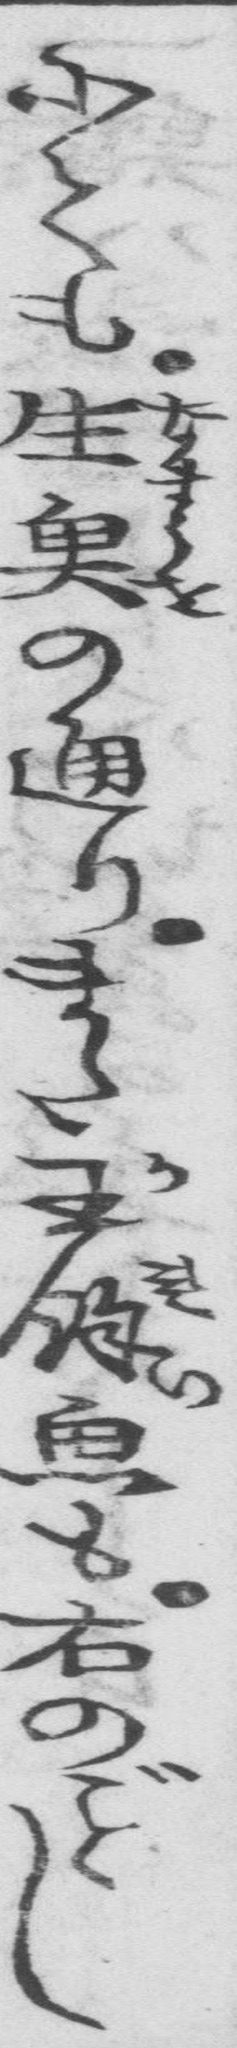にても。生魚の通り。また王余魚も。右のごとし
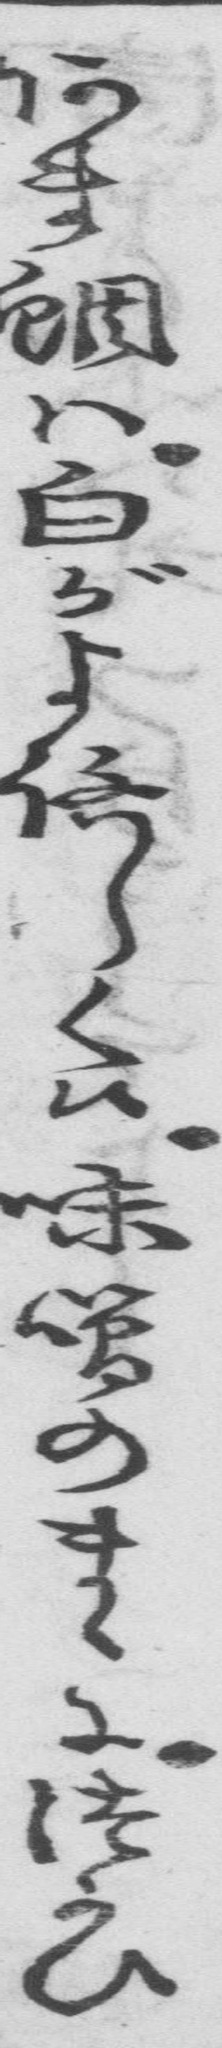あま鯛は。白がよろしく候。味噌のまゝに。つかひ
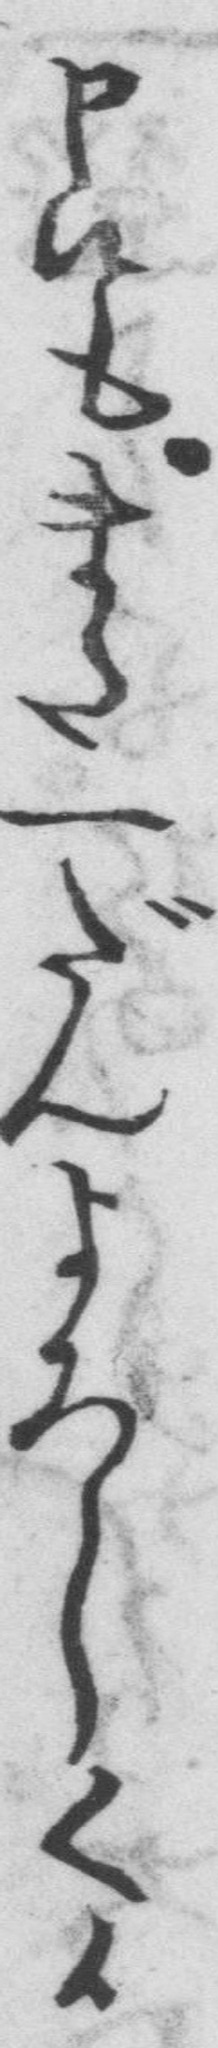申候も。また一だんよろしく候

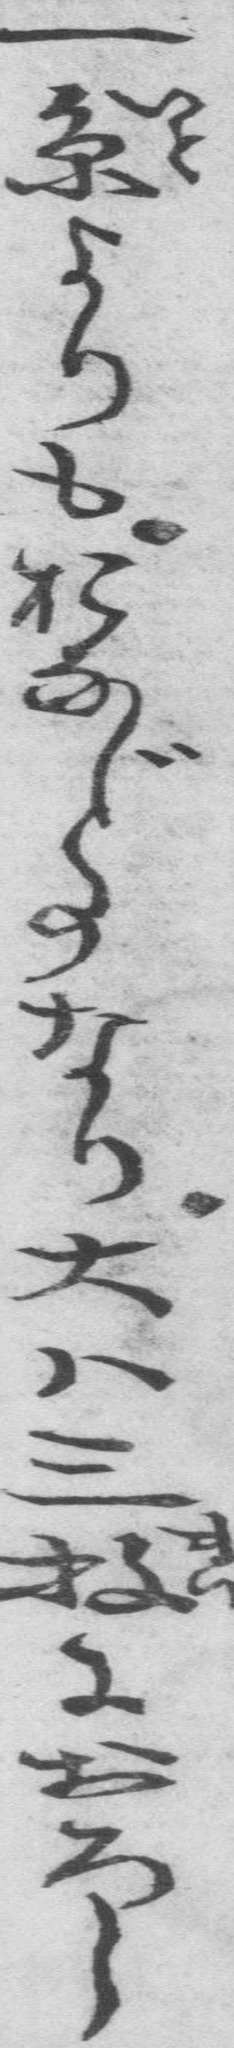一糸よりも。おなじ事なり。大は三枚におろし
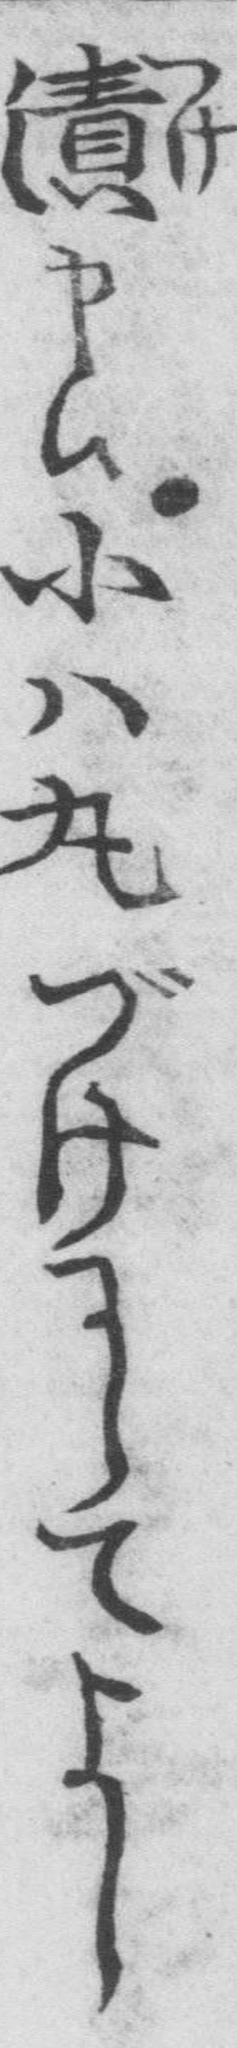漬申候。小は丸づけにしてよし
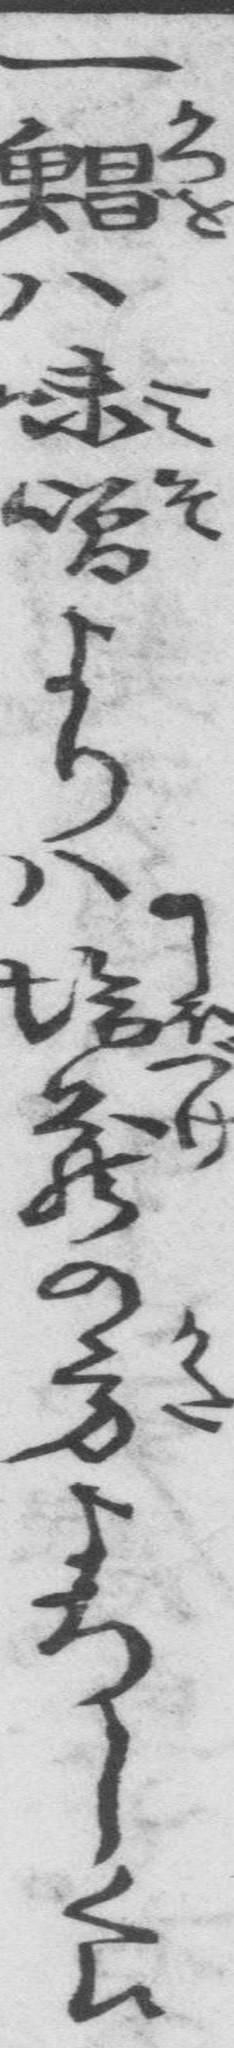一鯧は味噌よりは。塩蔵の方よろしく候
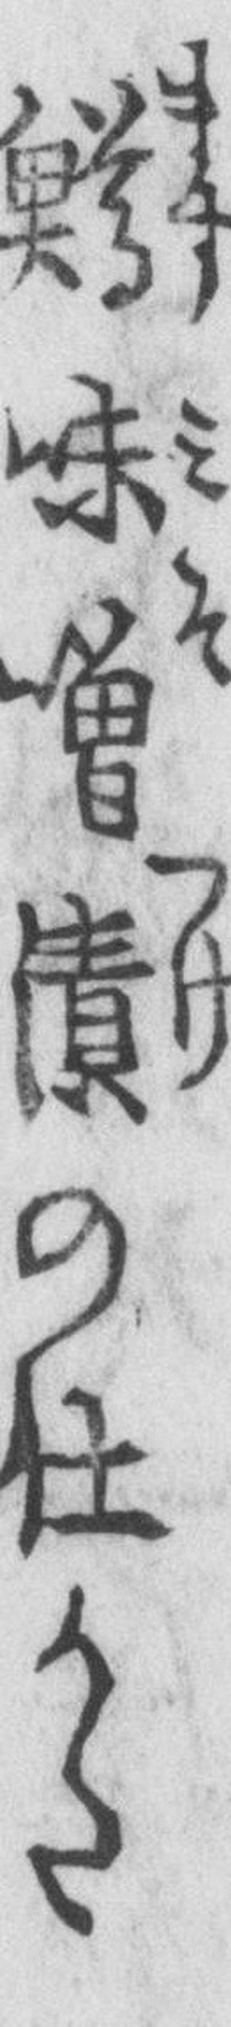鱒味噌漬の仕かた
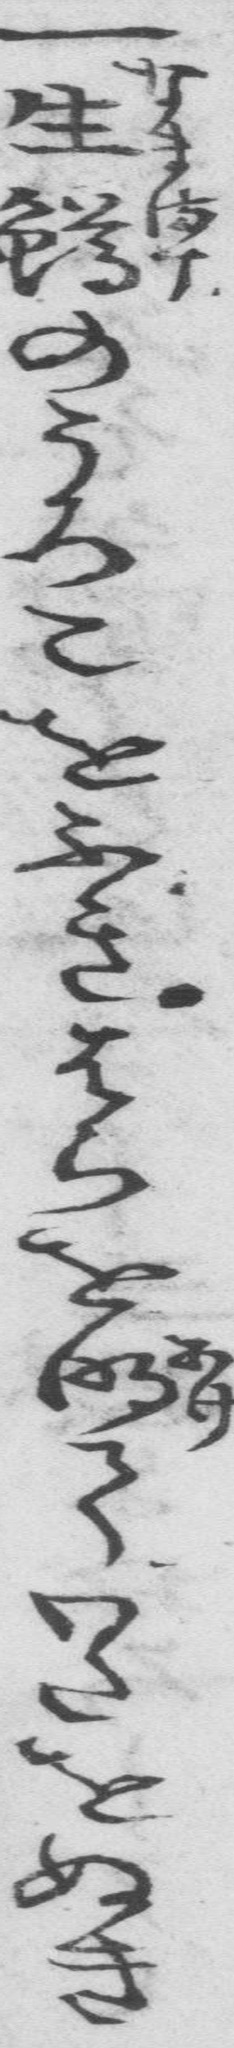一生鱒のうろこをふき。はらを明てわたをぬき
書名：萬寳料理秘密箱
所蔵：大阪府立大学学術情報センター 国文学研究資料館
